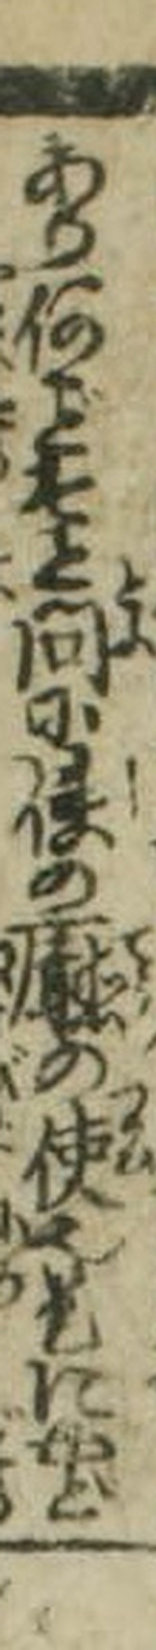あり何ごとそと問に使の庁の使也是にやど
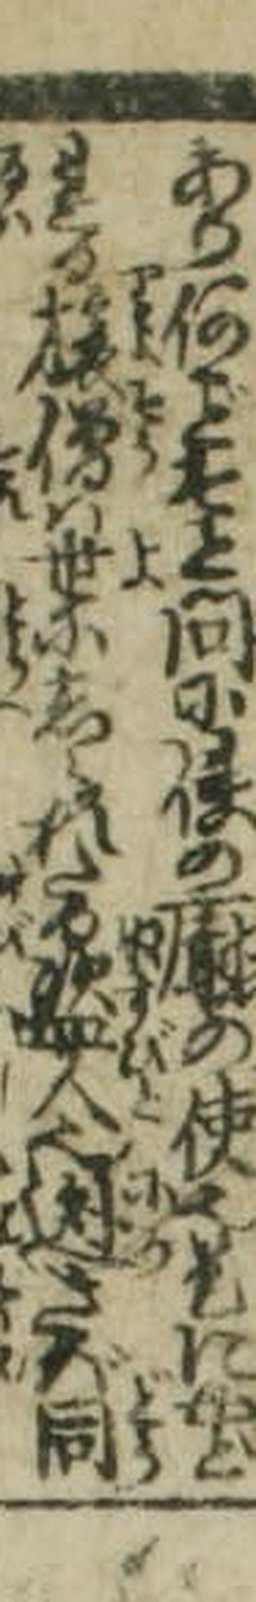する旅僧は世にしられたる盗人也逃さば同
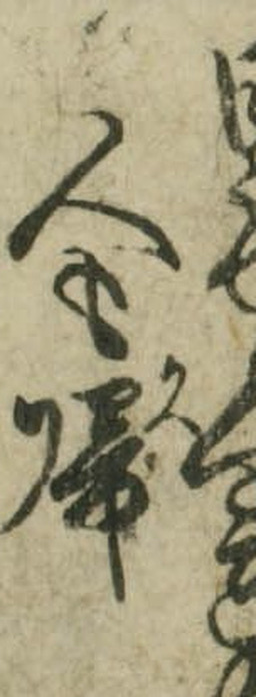人も帰
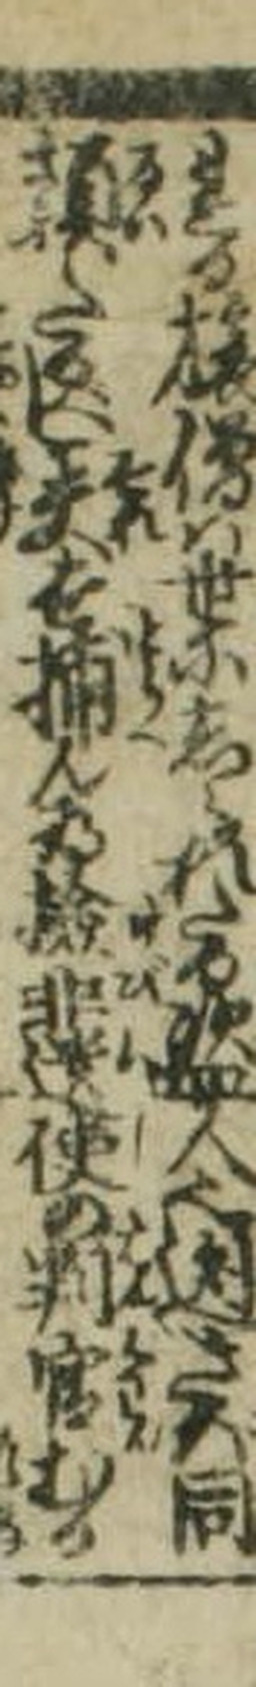類たるべし夫を捕ん為検非違使の判官むか
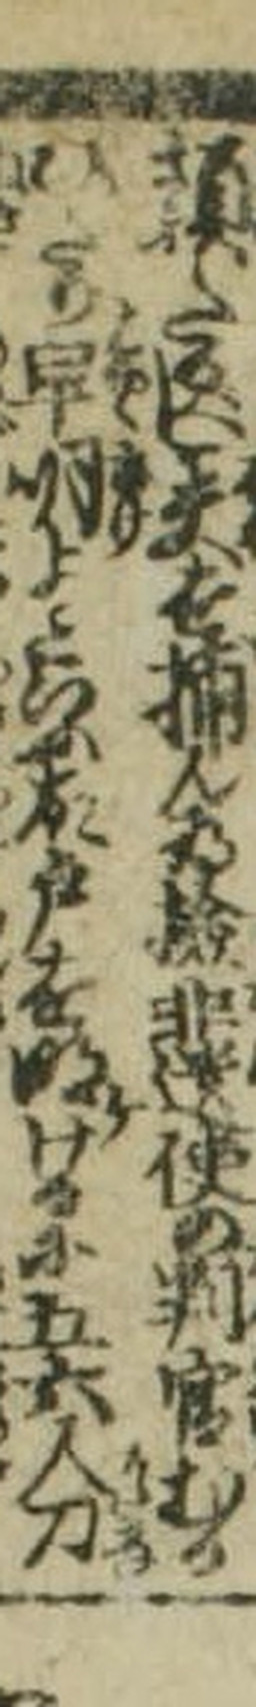ひたり早明よといふ故戸を明けけるに五六人刀
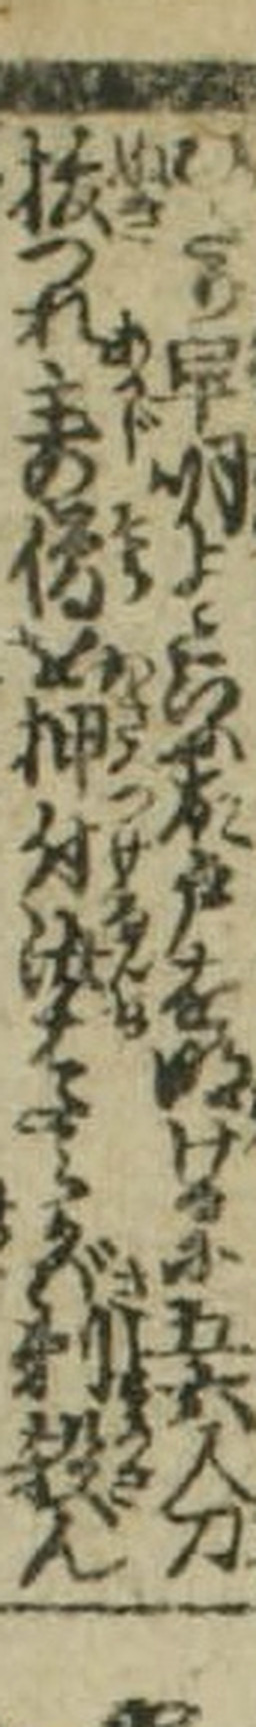抜つれ主の僧を押付汝はたらかば刺殺ん
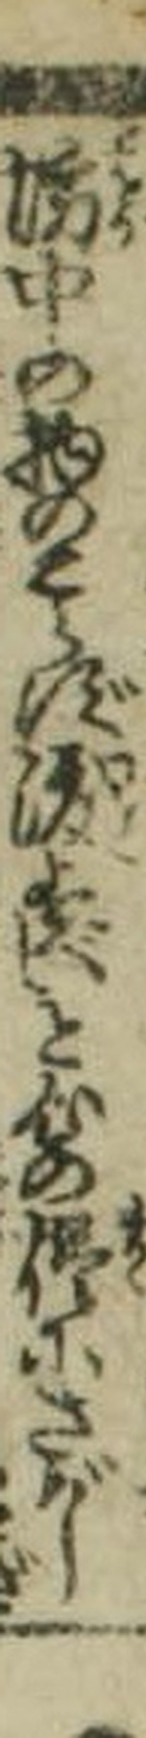坊中の物のこらず渡すべしと心の侭にさがし
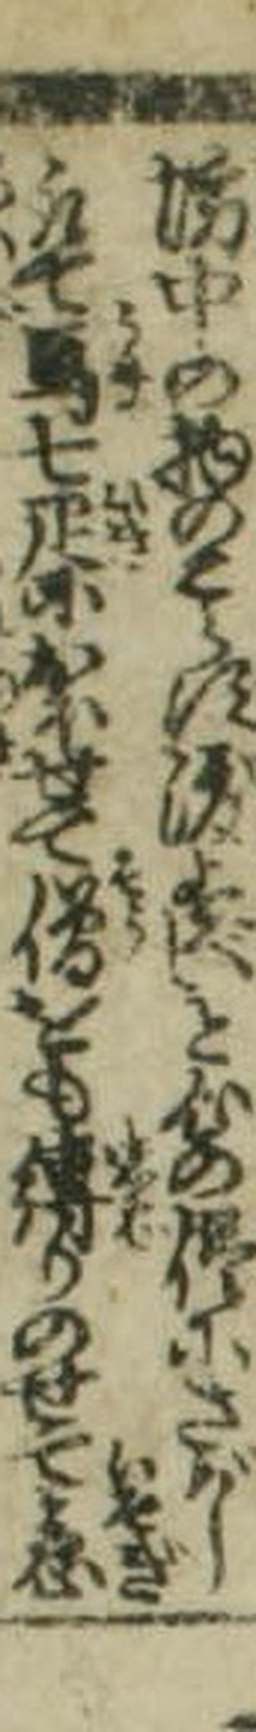取て馬七疋におほせて僧をも縛りのせて急
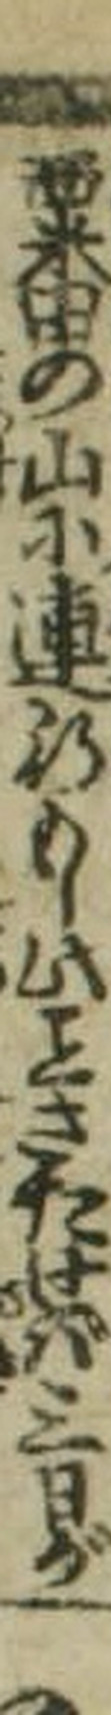粟田の山に連行もし此ことさたせば三日が
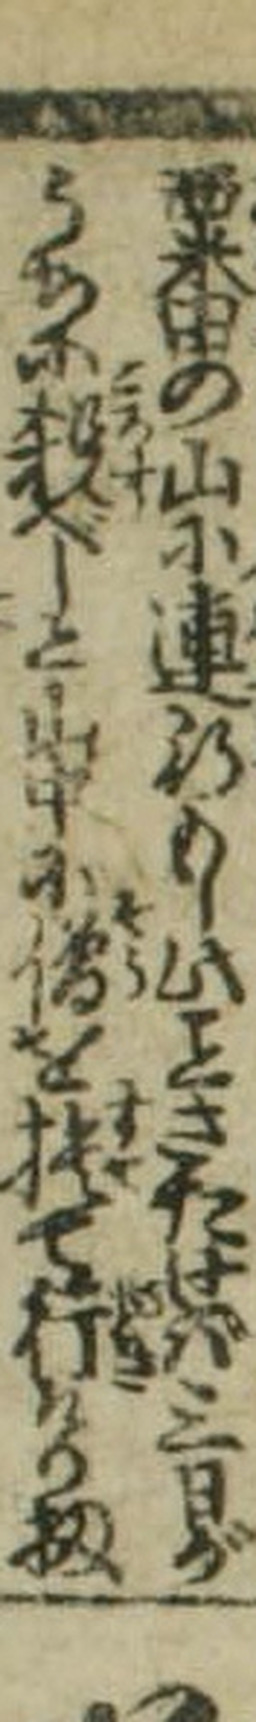うちに殺べしと山中に僧を捨て行けり扨
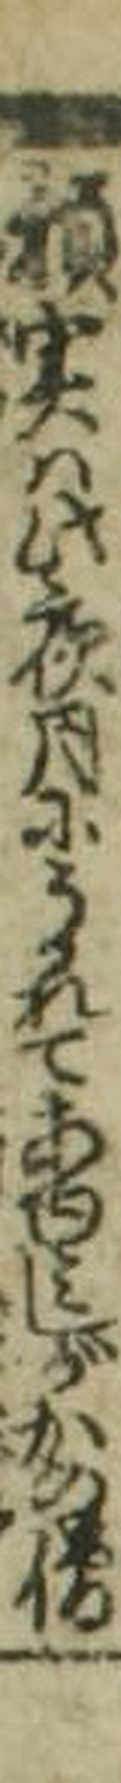頼実は此夜月にうかれてあゆみしがかの僧
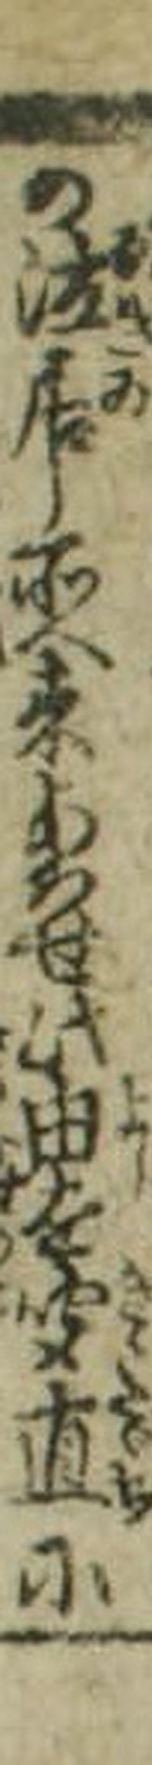の泣居し所へ来あはせ此由を聞直に
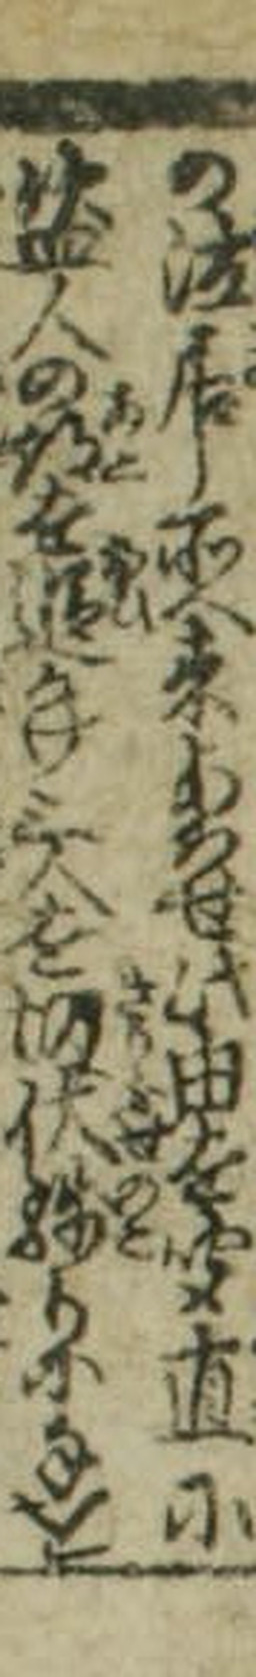盗人の跡を追かけ三人を切伏残りになを
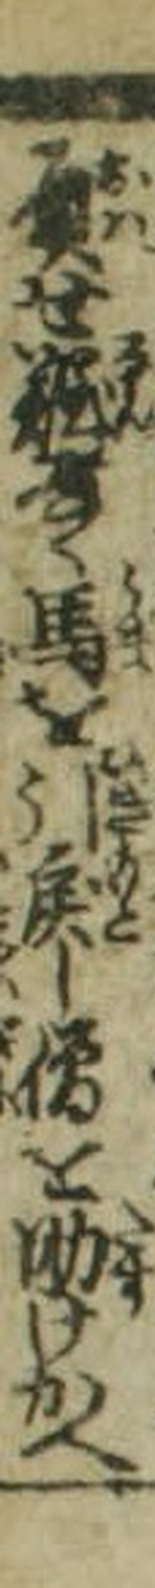負せ難なく馬を引戻し僧を助けかへ
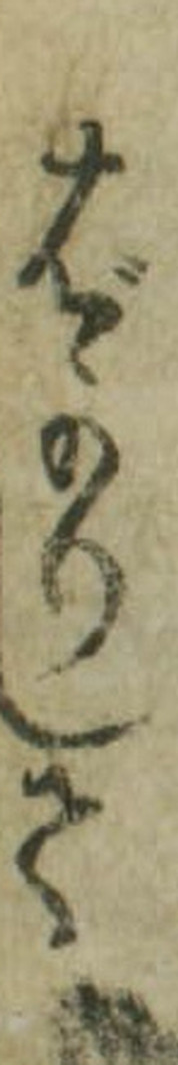ばかりして
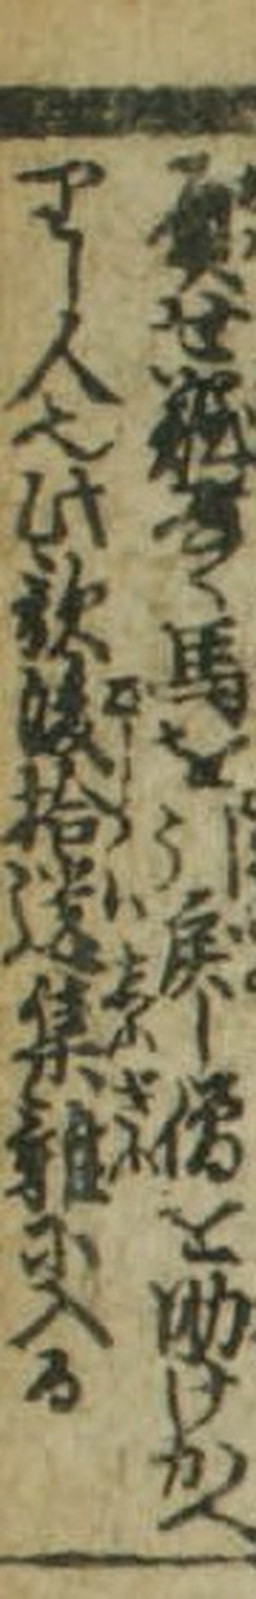りし人也此歌後拾遺集雑に入る
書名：續英雄百人一首
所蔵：東京学芸大学附属図書館
